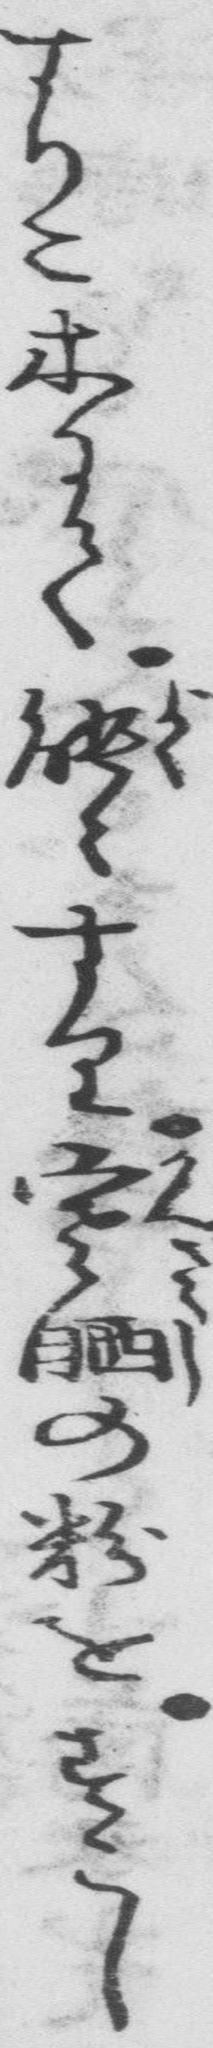すりこ木にて。能々すり。寒晒の粉を。すこし
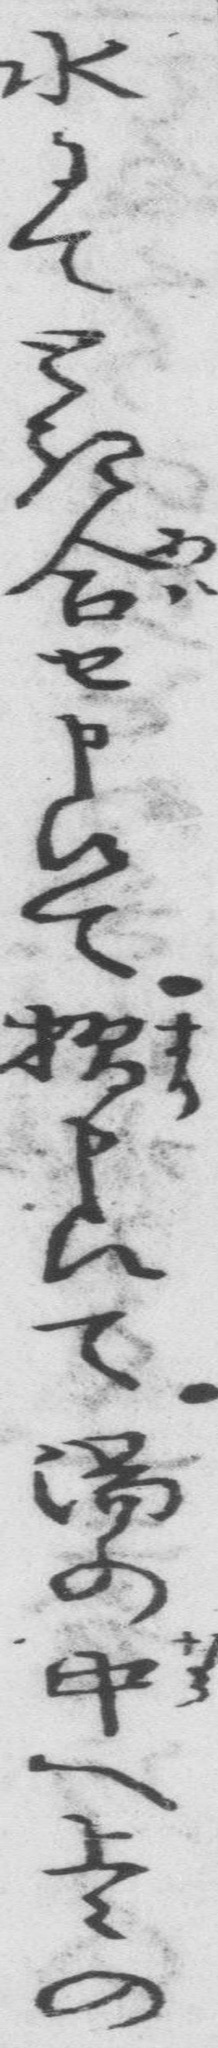水にてとき合せ申候て。摺申候て。湯の中へ上々の
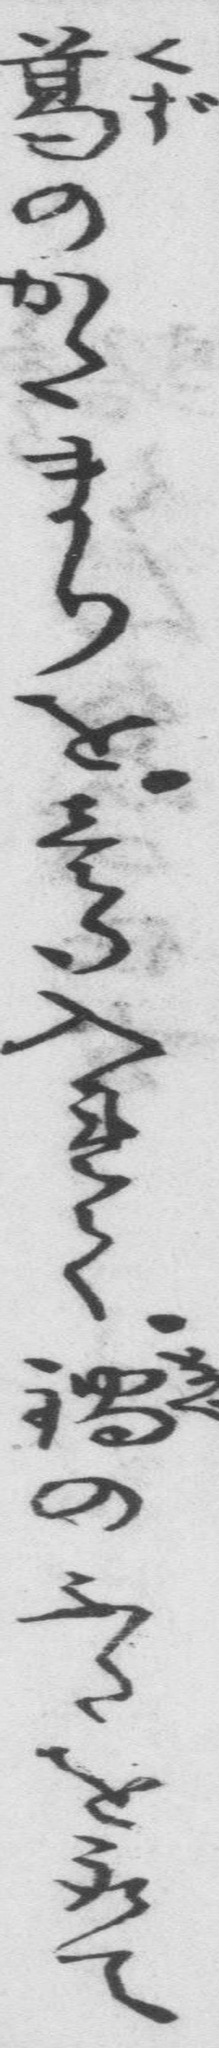葛のかたまりを。すり入れて。鍋のふたを取て
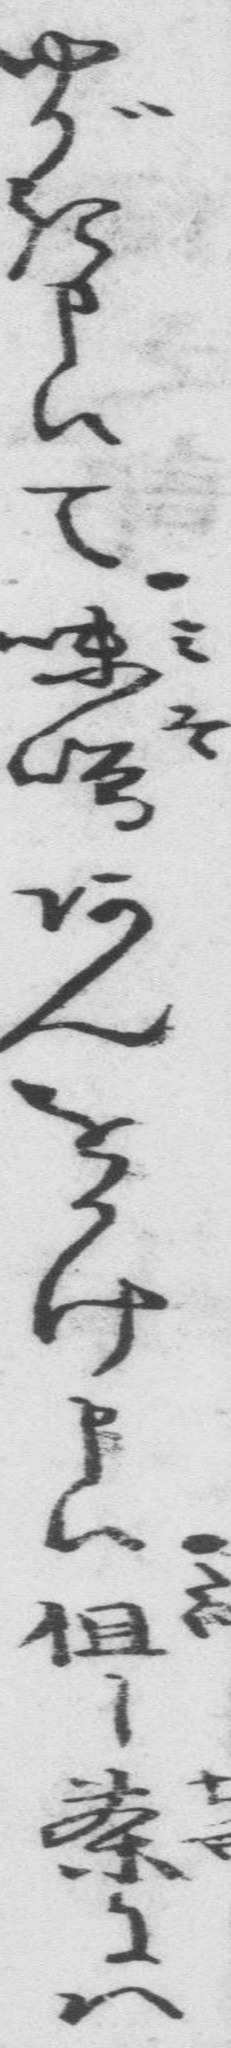ゆがき申候て。味噌あんをかけ申候。但し茶には
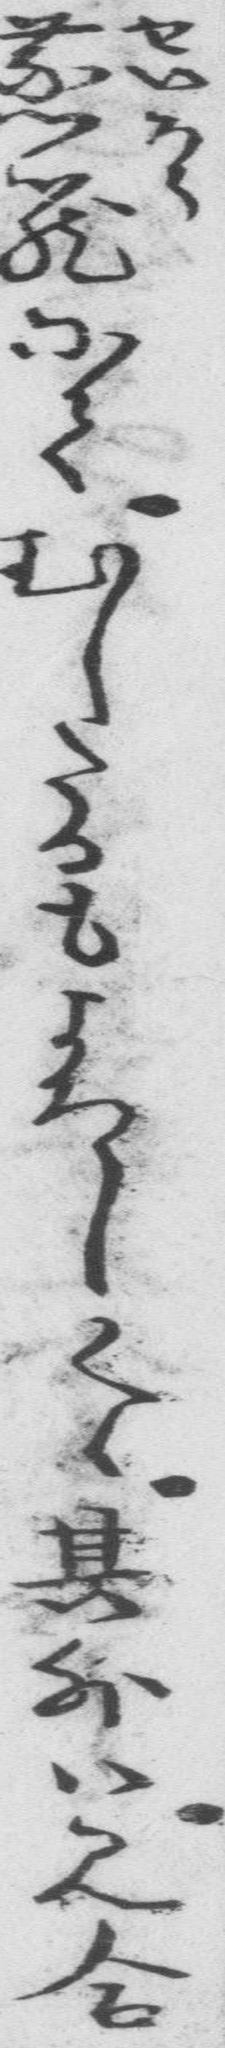蒸籠にて。むしたるもよろしく候。其外は。見合
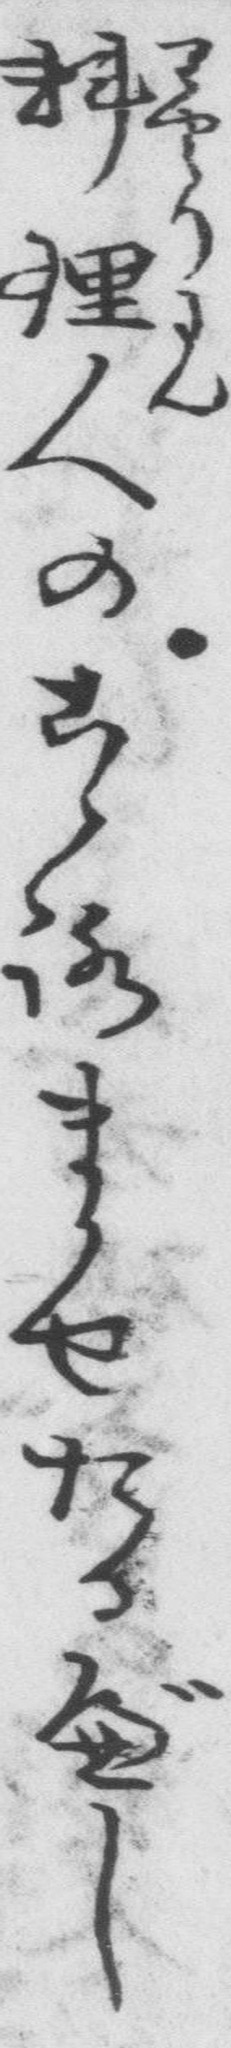料理人の。こゝろまかせたるべし
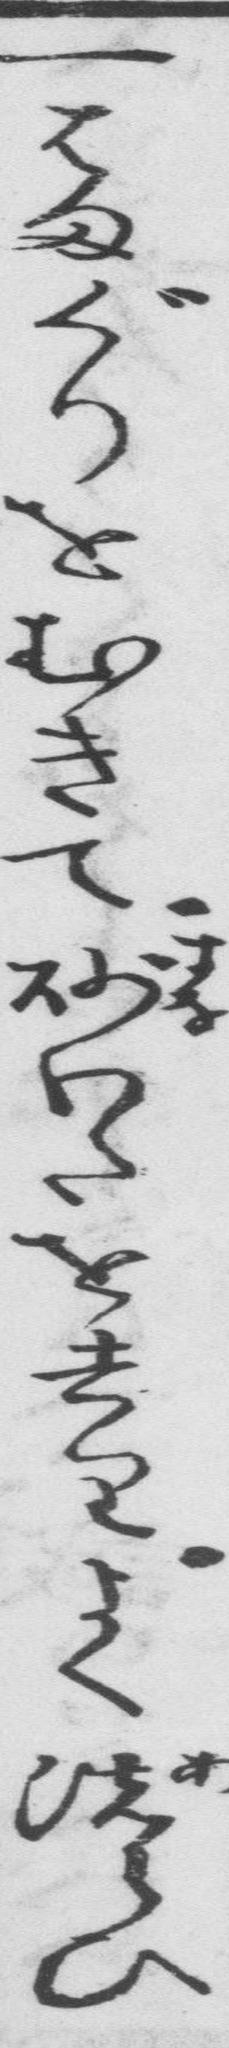一はまぐりをむきて。砂わたを去り。よく洗らひ
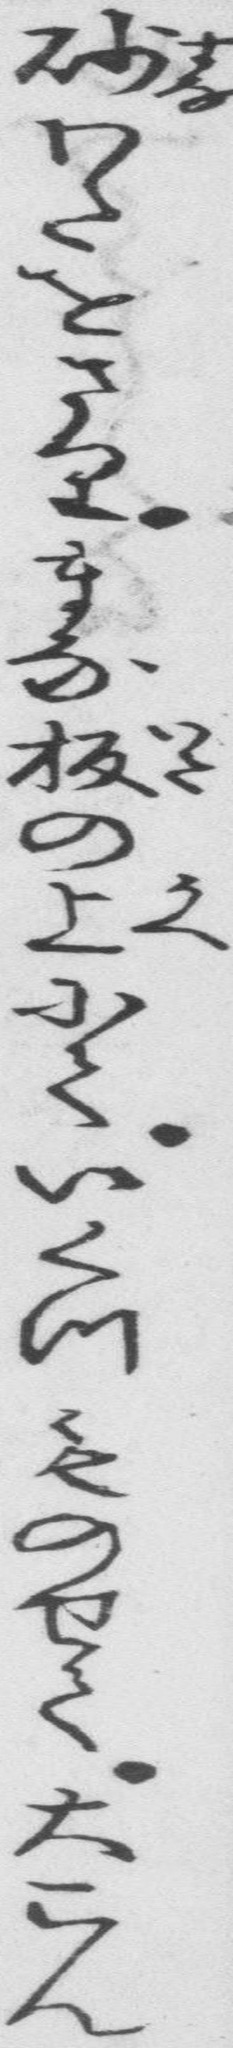砂わたをさり。まな板の上にて。いくつものせて。大こん
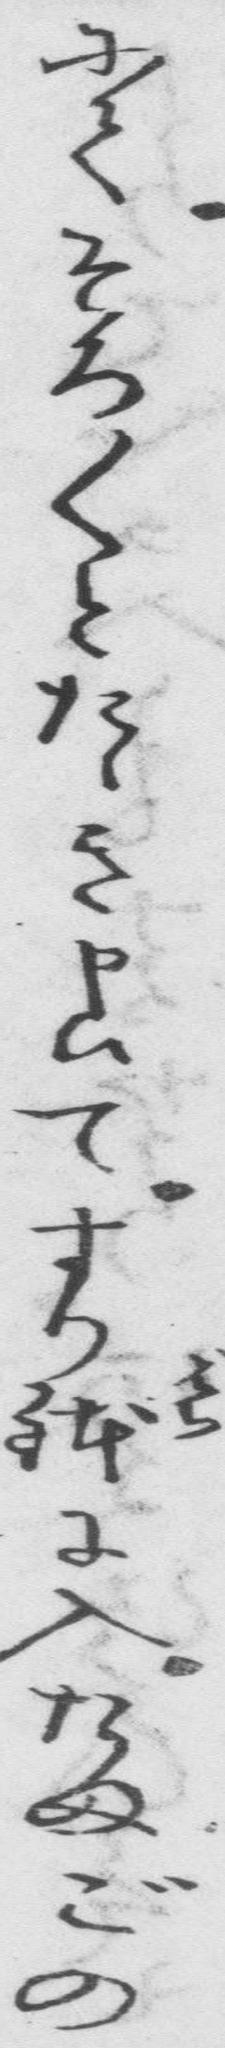にて。そろ〳〵とたゝき申候て。すり鉢に入。たまごの
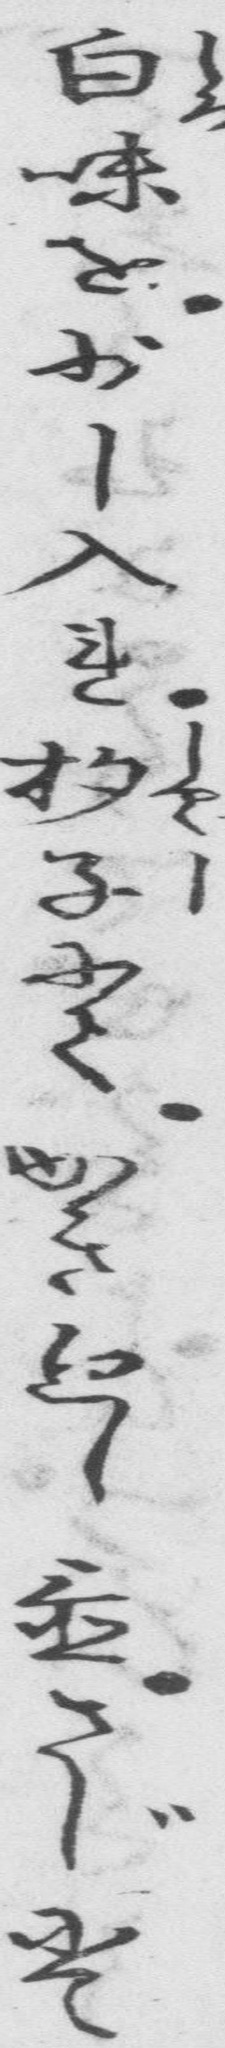白味を。少し入れ。杓子にて。かき廻し置。さじにて
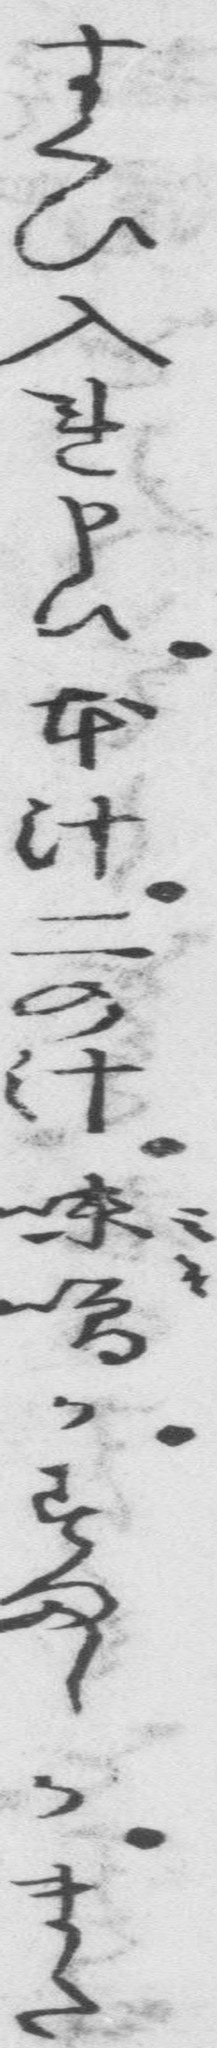すくひ入れ申候。本汁。二の汁。味噌か。すましか。また
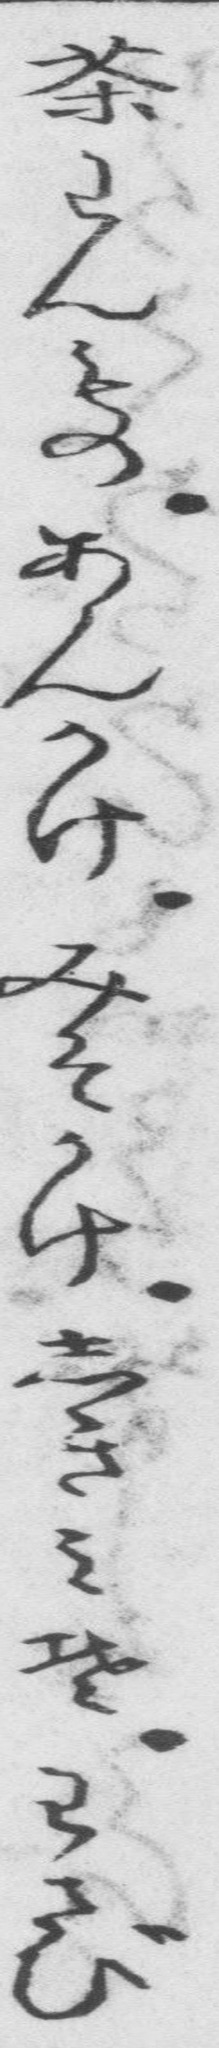茶わんもの。あんかけ。みそかけ。しきみそ。わさび
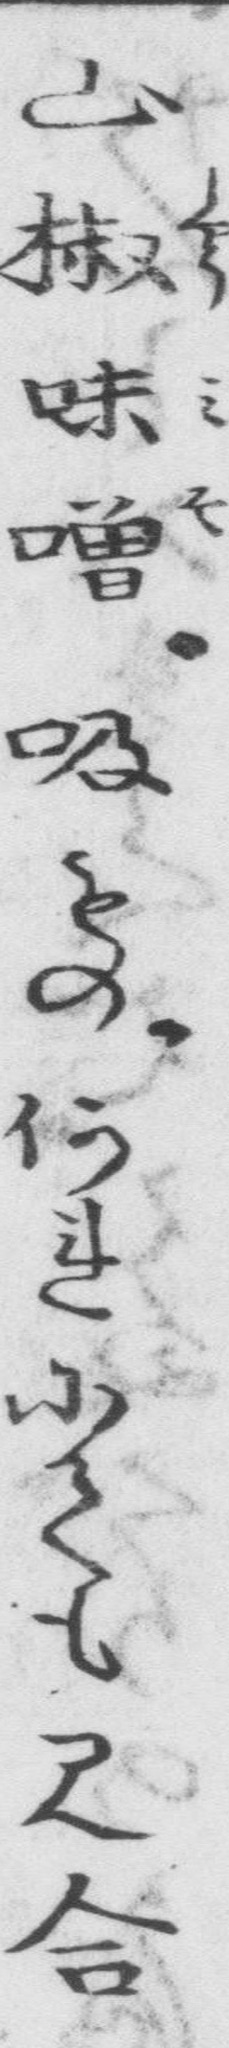山椒味噌。吸もの。何れにても見合
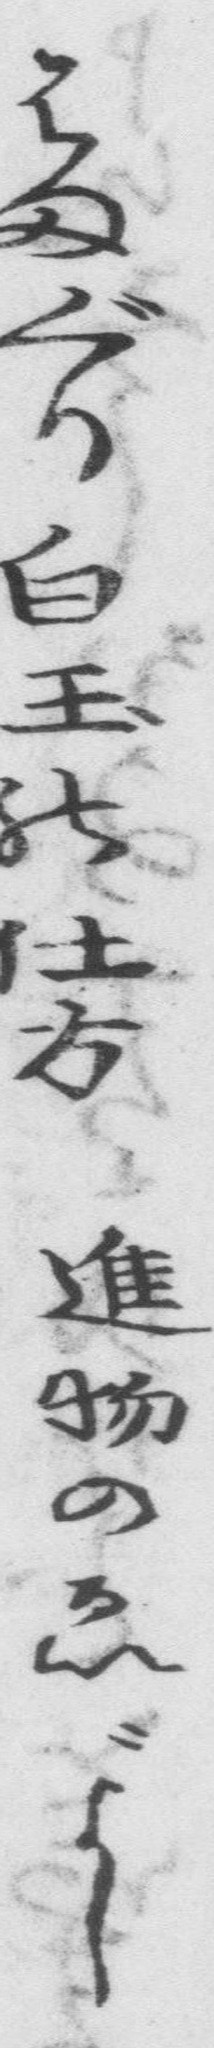はまぐり白玉の仕方進物のるいによし
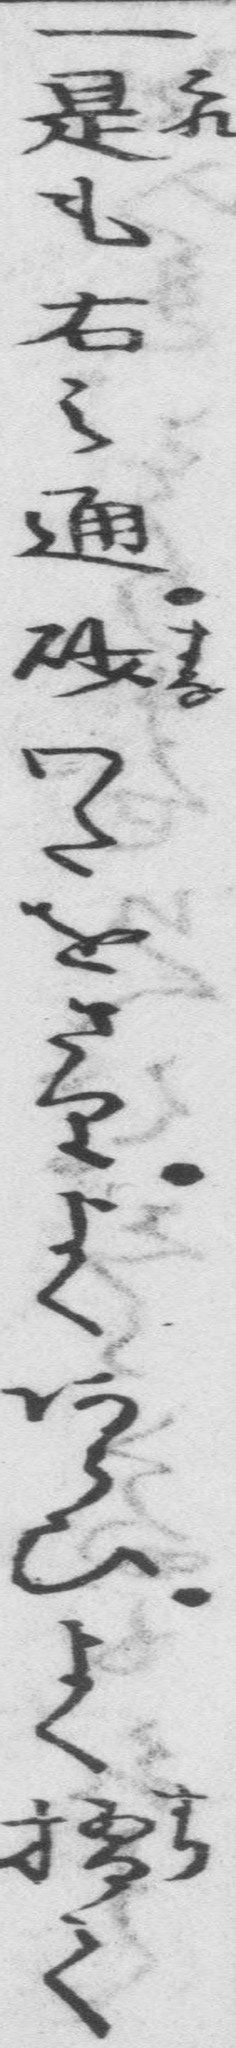一是も右の通。砂わたをさり。よくあらひ。よく摺て
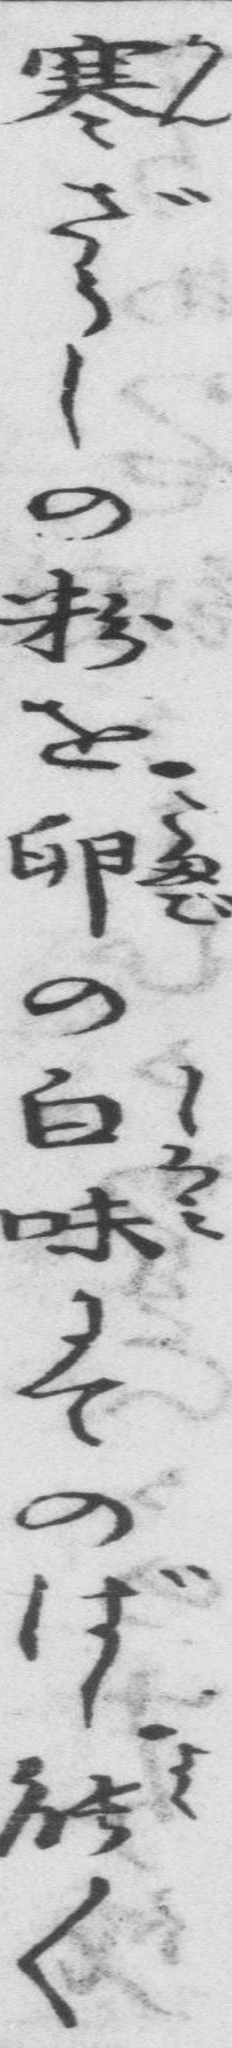寒ざらしの粉を。卵の白味にてのばし。能〳〵
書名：萬寳料理秘密箱
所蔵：大阪府立大学学術情報センター 国文学研究資料館
